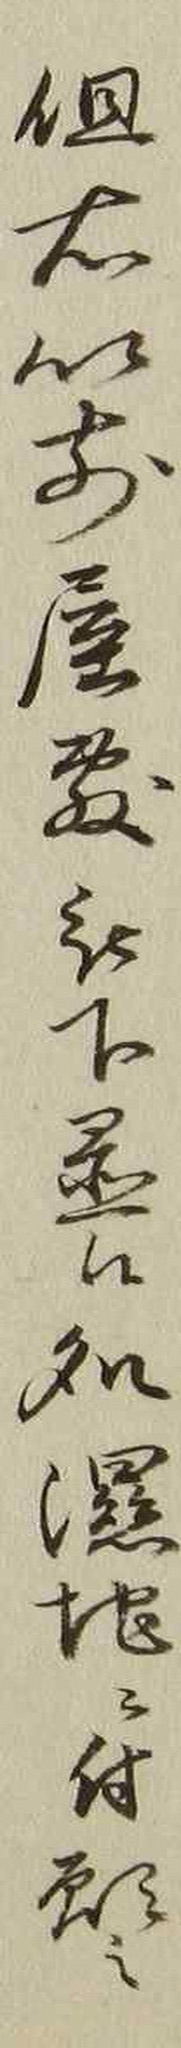但右以前屋敷被下置候処湿地に付願之
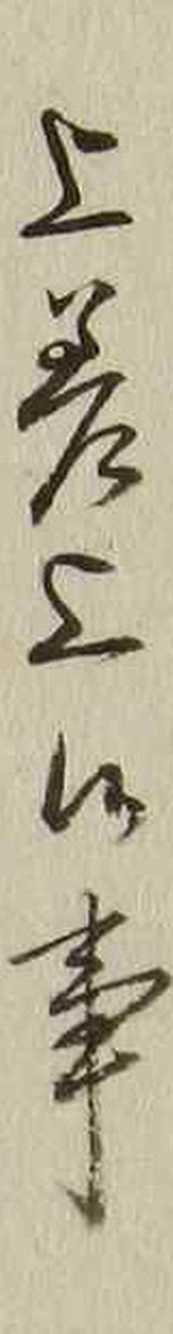上差上候事
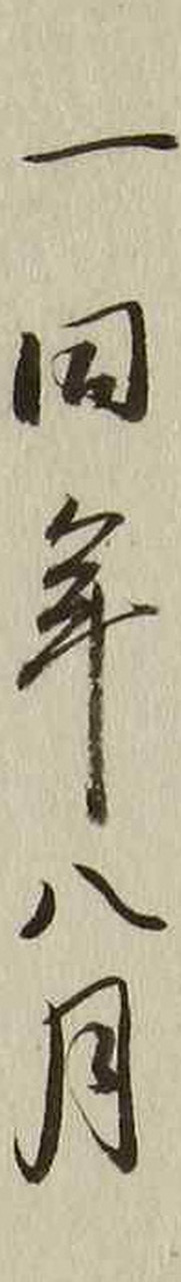一同年八月
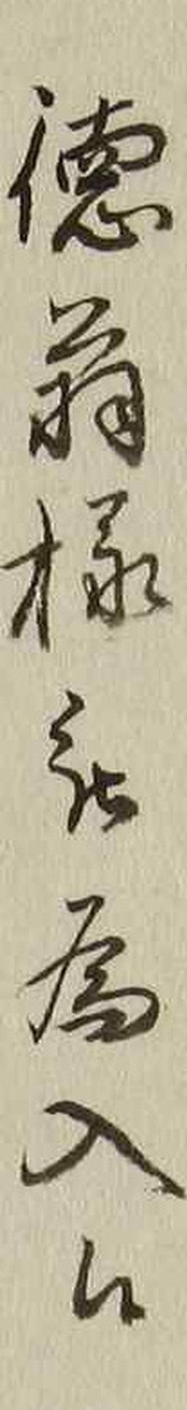徳翁様被為入候
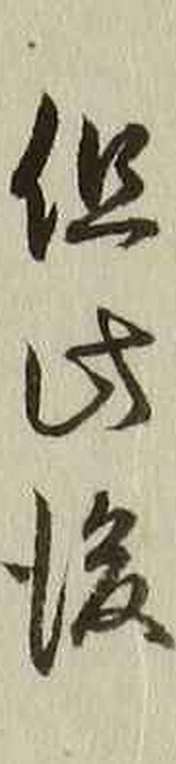但此後
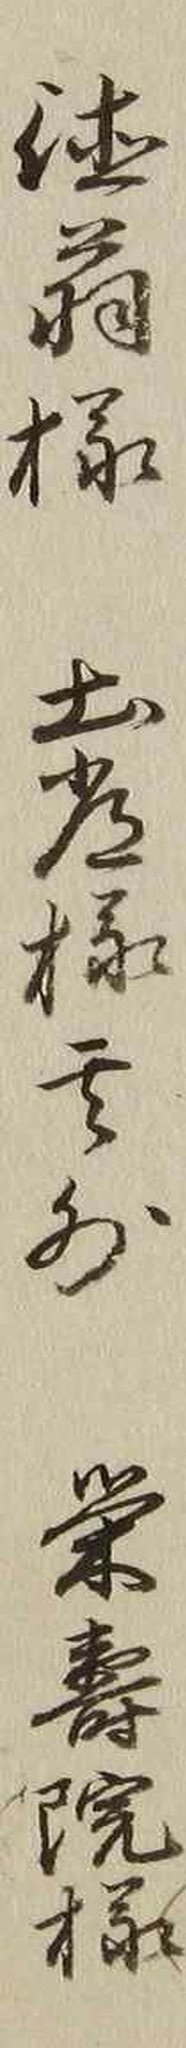徳翁様土常様其外栄寿院様
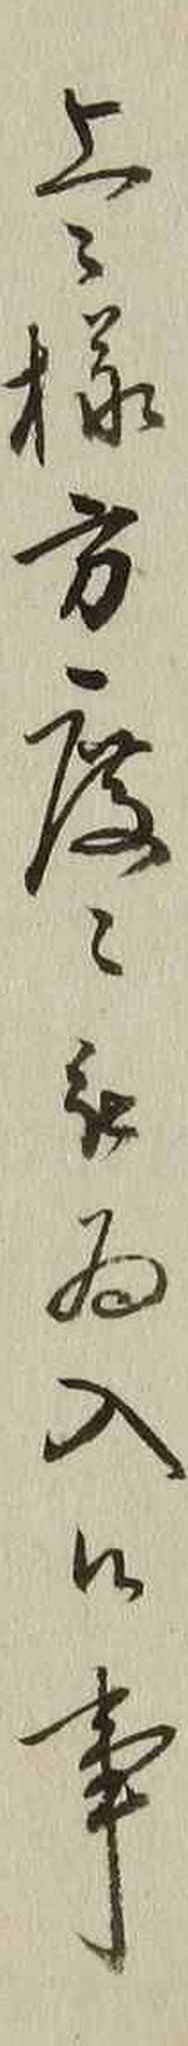上々様方度々被為入侯事
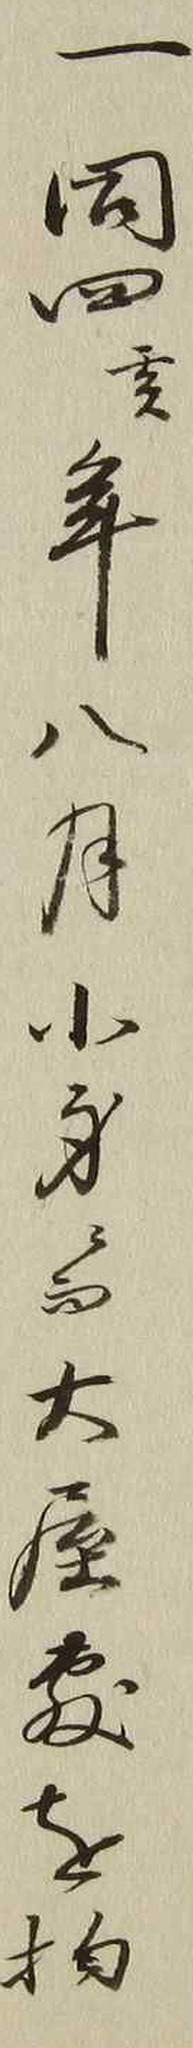一同四亥年八月小身に而大屋敷を拘
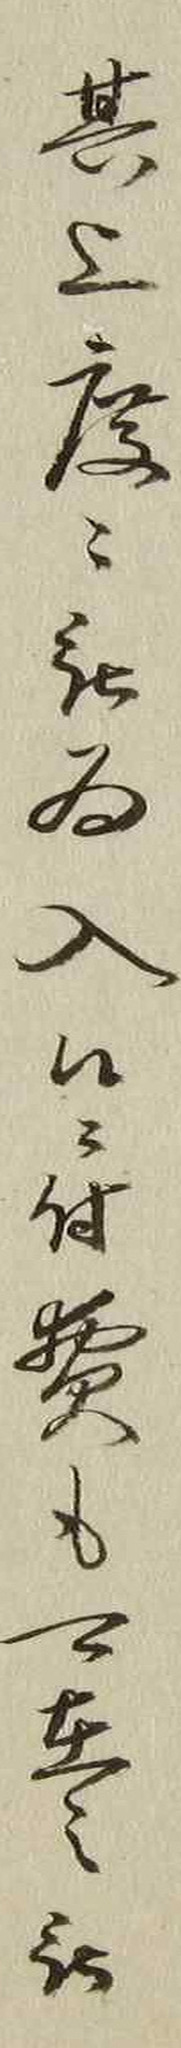其上度々被為入候に付費も可在之被
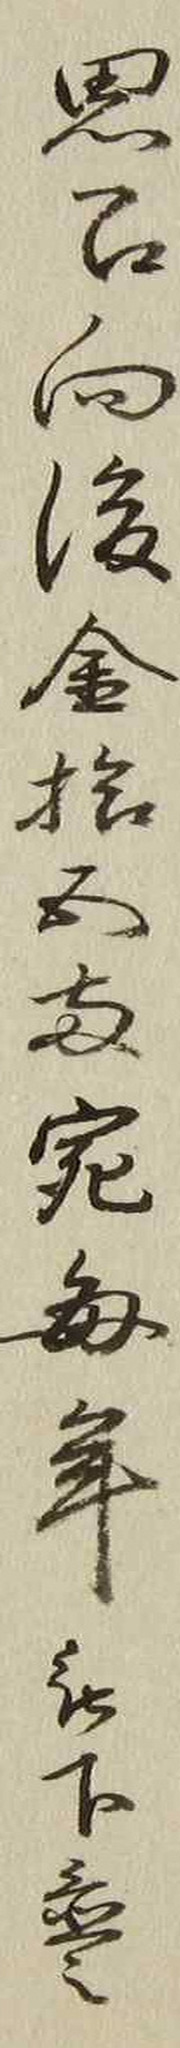思召向後金拾五両宛毎年被下置之
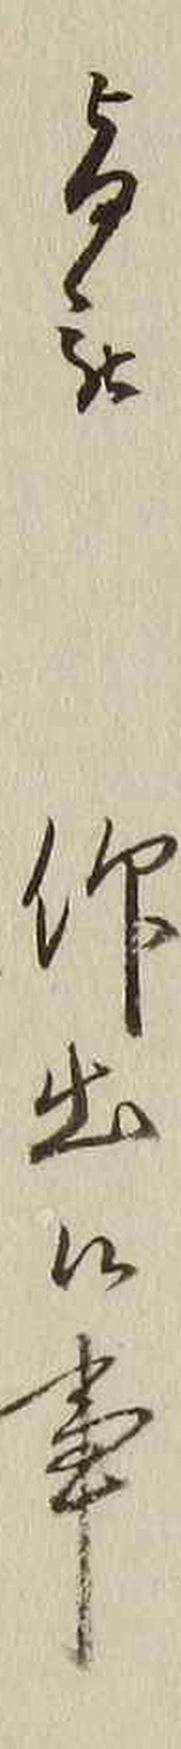旨被仰出候事
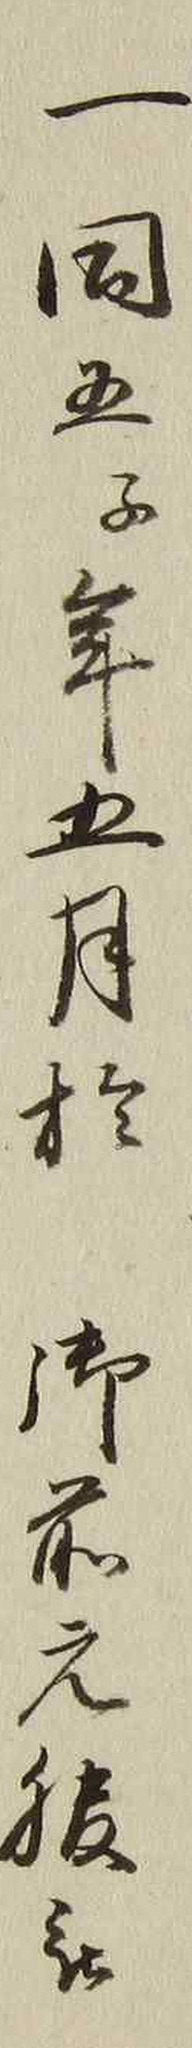一同五子年五月於御前元服被
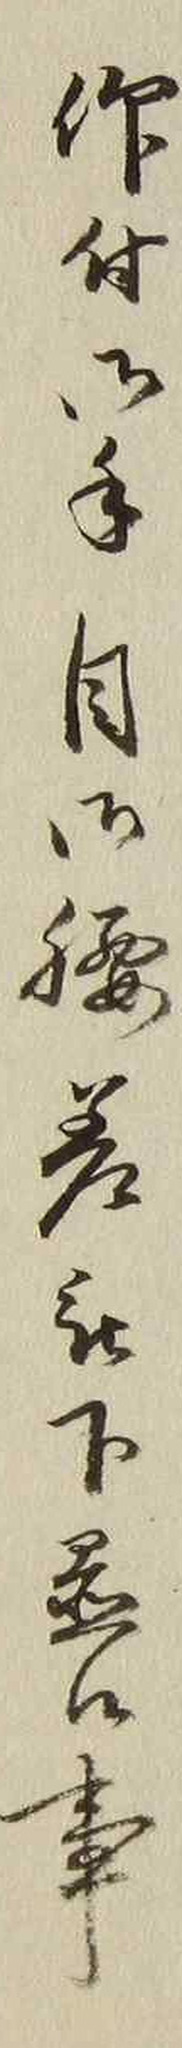仰付御手自御腰差被下置候事
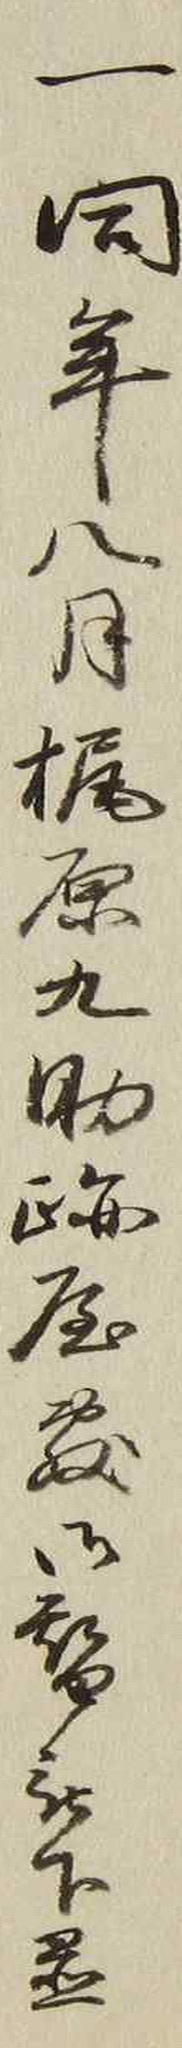一同年八月梶原九助跡屋敷御替被下置
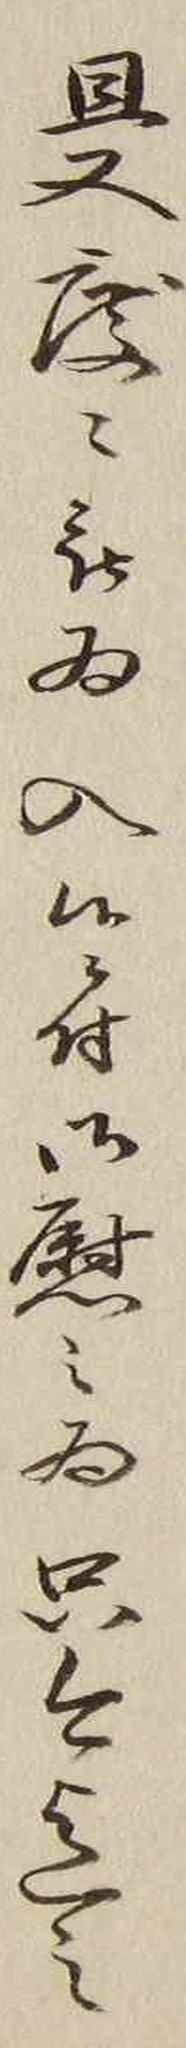且又度々被為入候に付御慰之為只今迄之
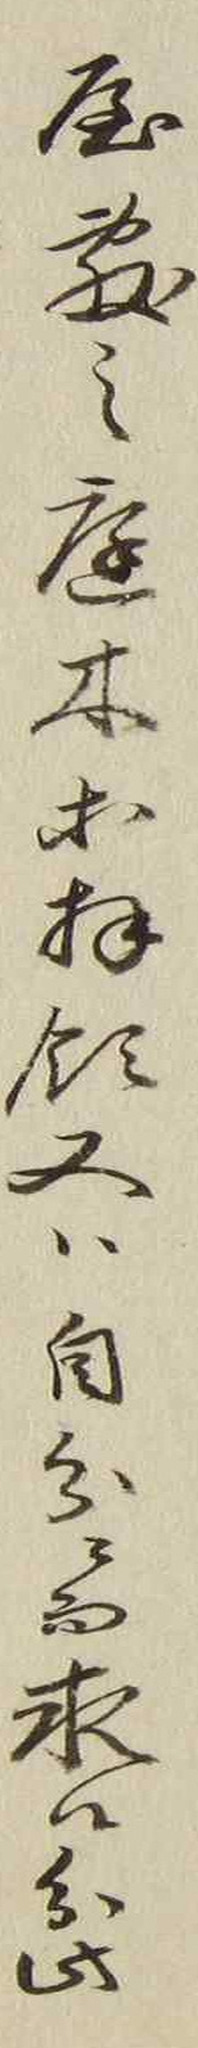屋敷之庭木等拝領又は自分に而求候分此
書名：諸士系譜　巻之133　た之部9
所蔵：会津若松市立会津図書館
